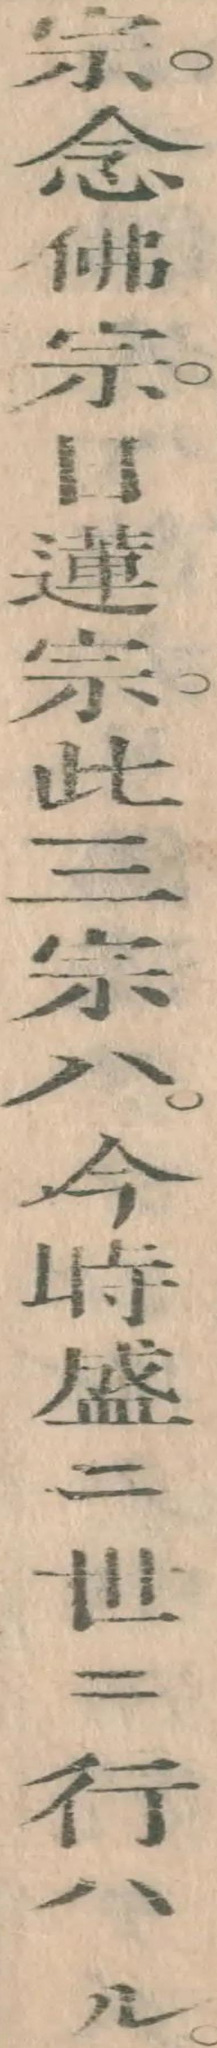宗。念仏宗。日蓮宗。此三宗ハ。今時盛ニ世ニ行ハル。
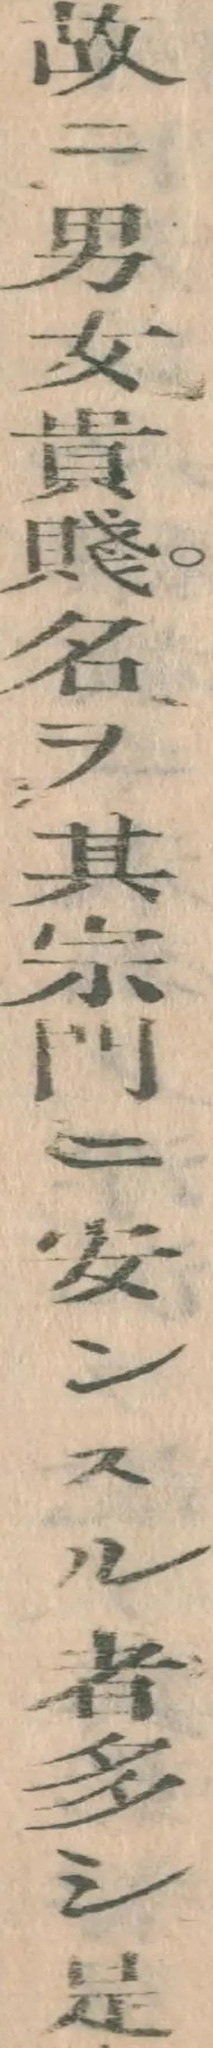故ニ男女貴賤。名ヲ其宗門ニ安ンスル者多シ是
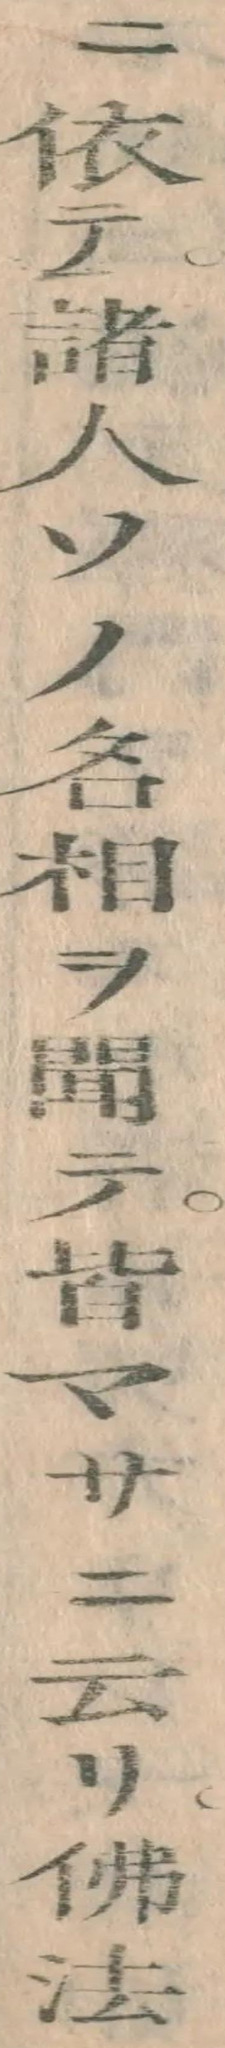ニ依テ。諸人ソノ名相ヲ聞テ。皆マサニ云リ。仏法
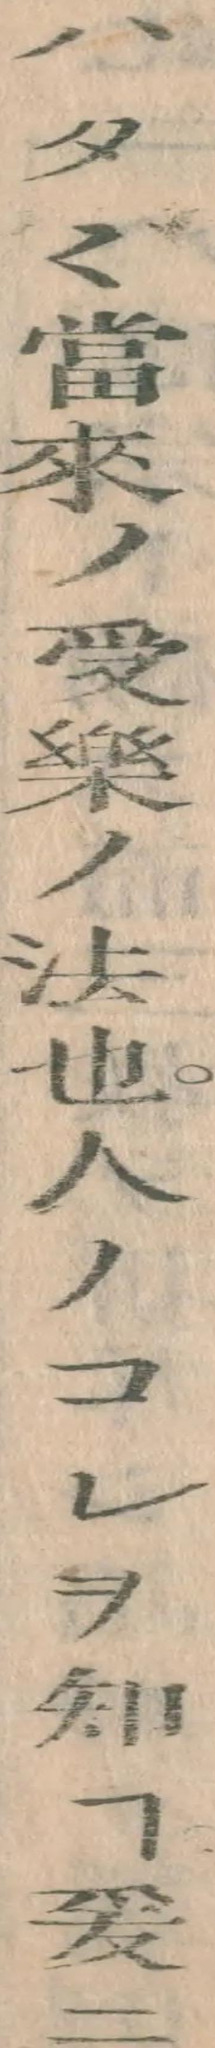ハタ〱当来ノ受楽ノ法也。人ノコレヲ知ヿ爰ニ
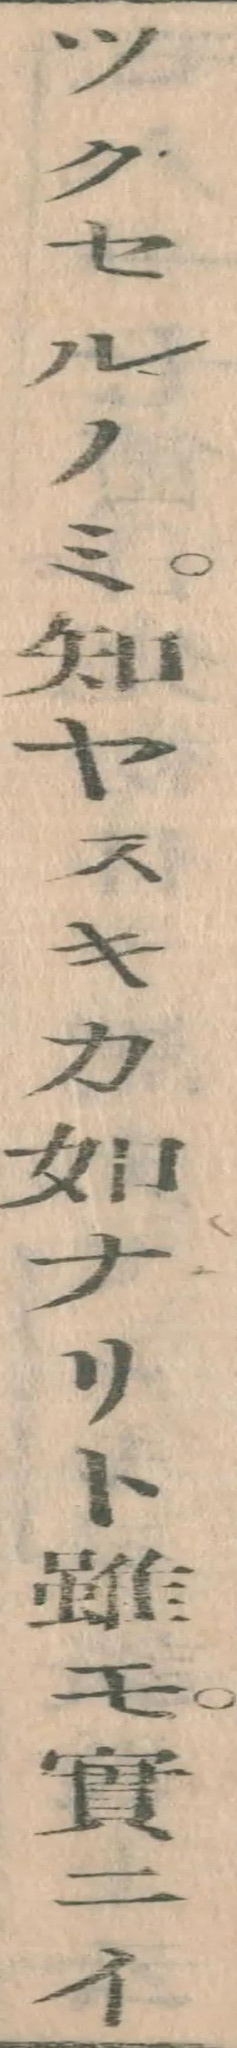ツクセルノミ。知ヤスキカ如ナリト雖モ。実ニイ
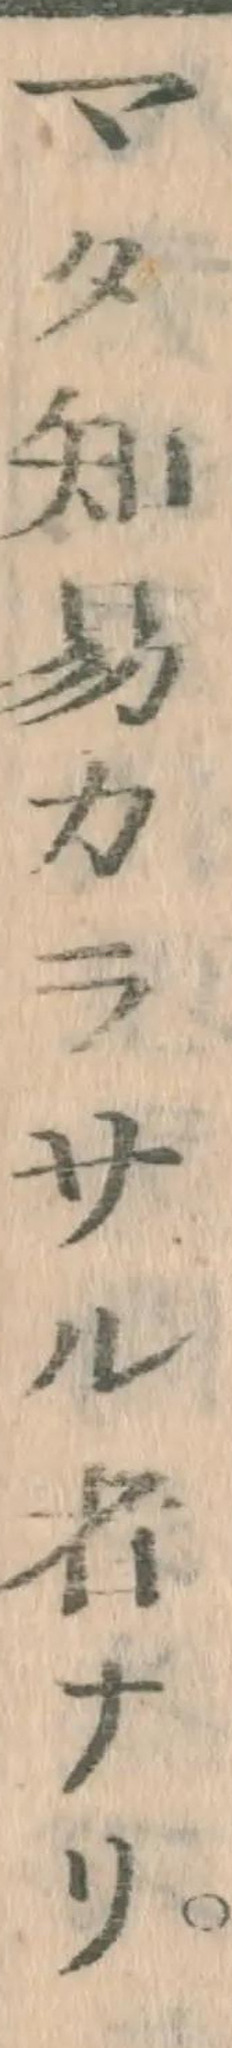マタ知易カラサル者ナリ。
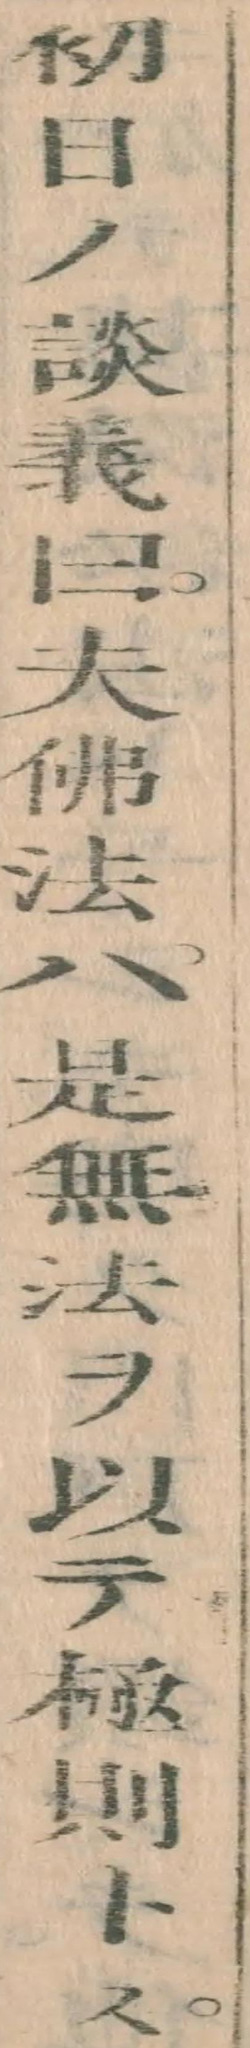初日ノ談義曰。夫仏法ハ。是無法ヲ以テ極則トス。
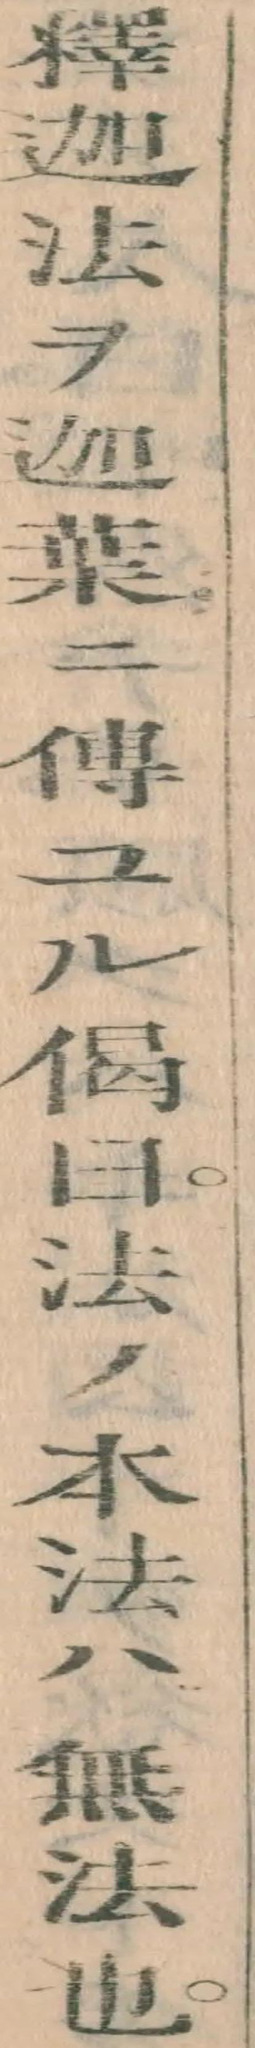釈迦法ヲ迦葉ニ伝ユル偈曰。法ノ本法ハ無法也。
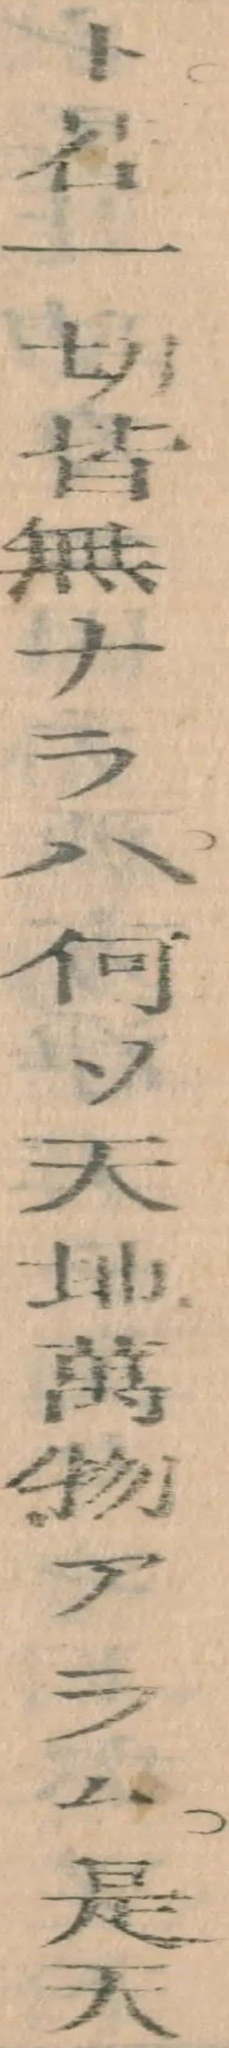ト。若一切皆無ナラハ。何ソ天地万物アラム。是天
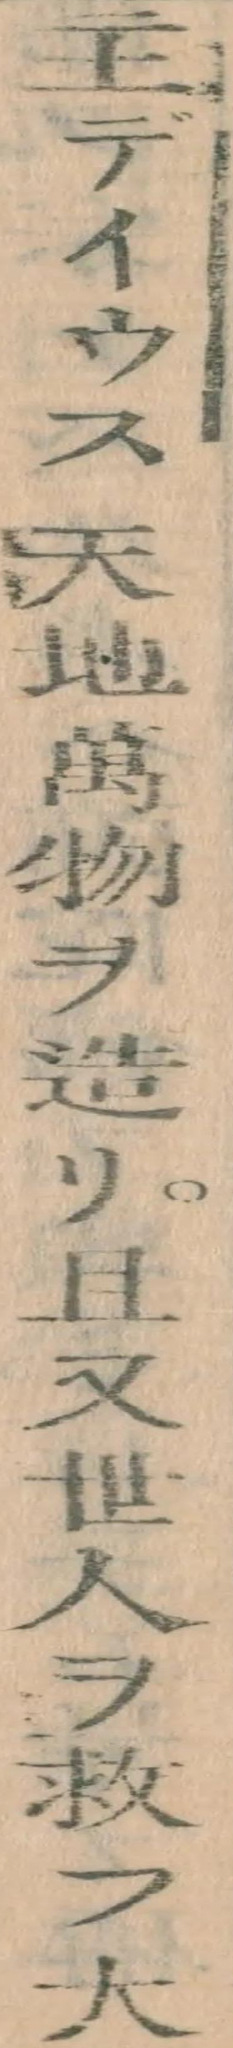主デイウス天地万物ヲ造リ。且又世人ヲ救フ大
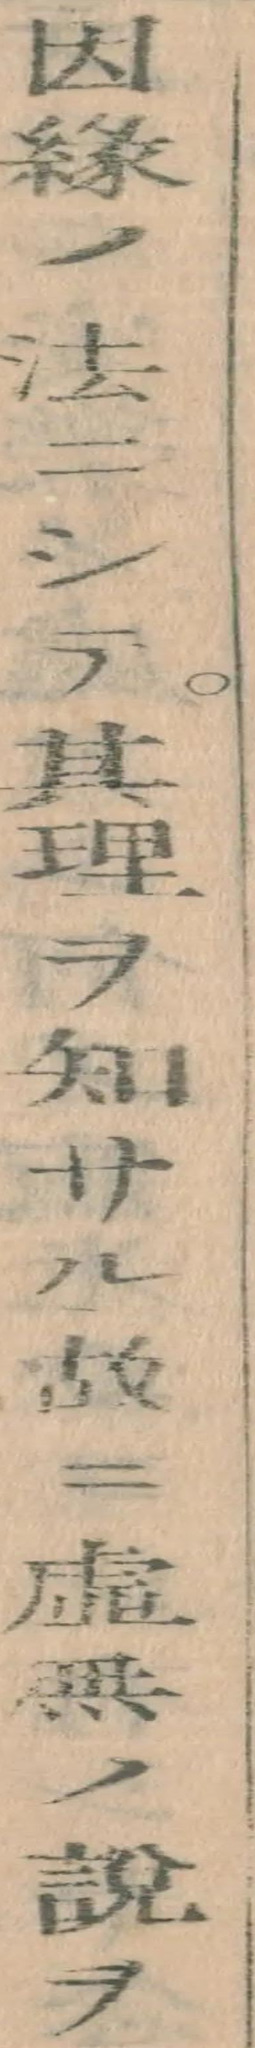因縁ノ法ニシテ。其理ヲ知サル故ニ虚無ノ説ヲ
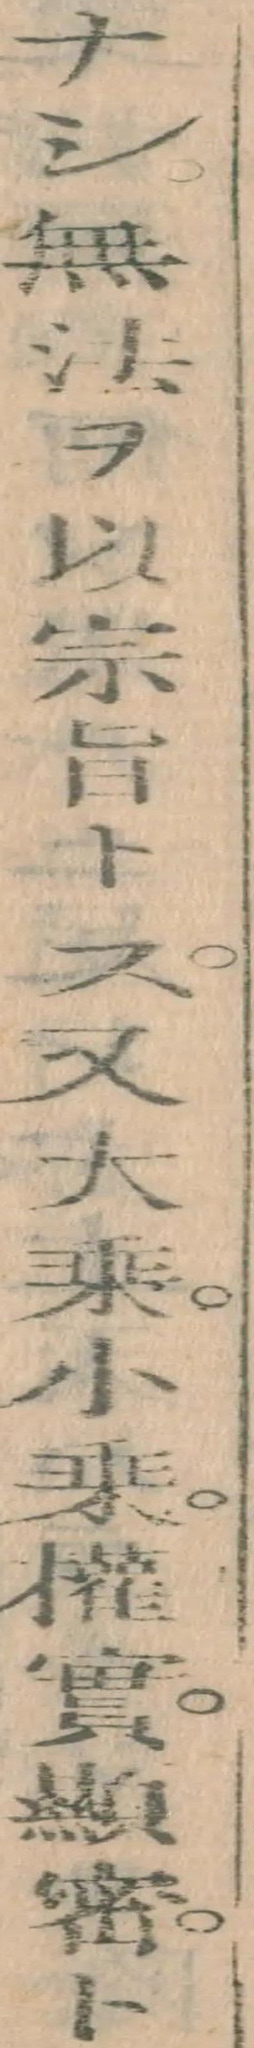ナシ。無法ヲ以宗旨トス。又大乗。小乗。権実。顕密。ト
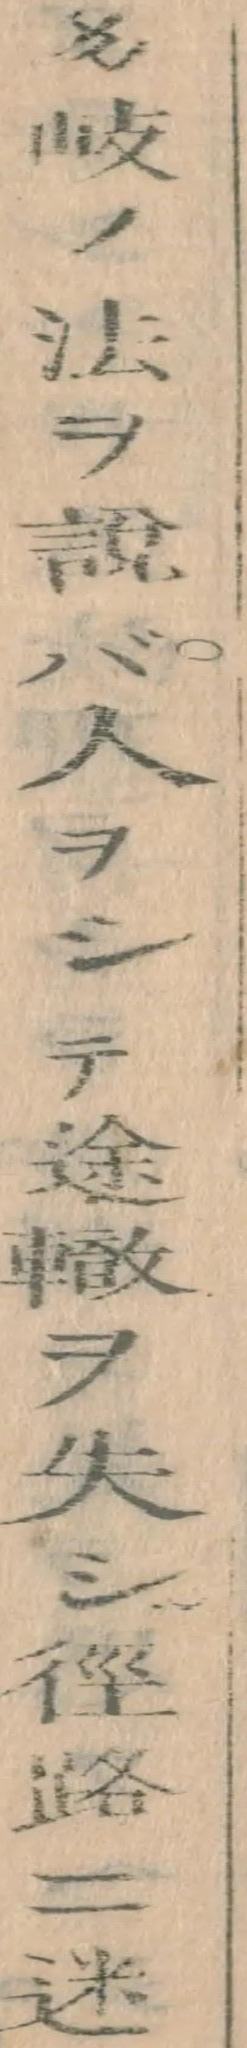多岐ノ法ヲ説バ。人ヲシテ途轍ヲ失シ径路ニ迷
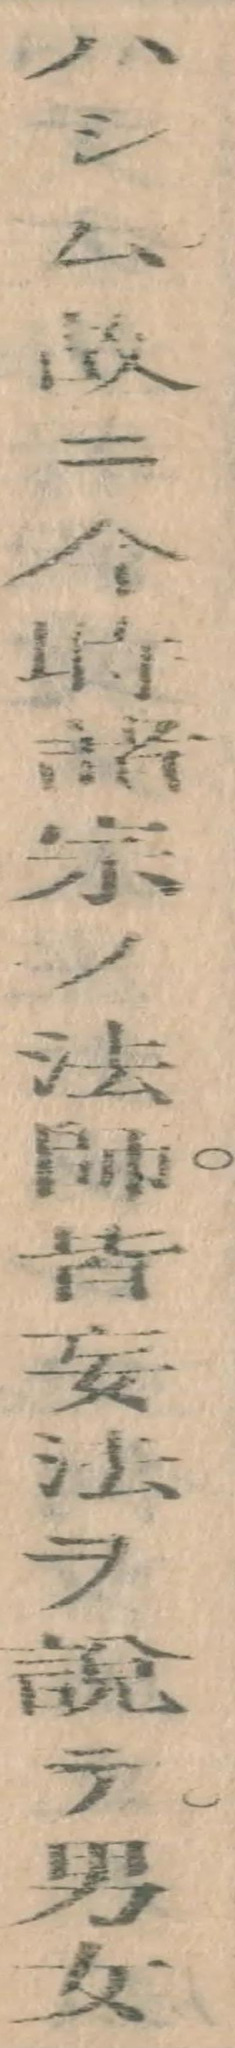ハシム。故ニ今時諸宗ノ法師。皆妄法ヲ説テ。男女
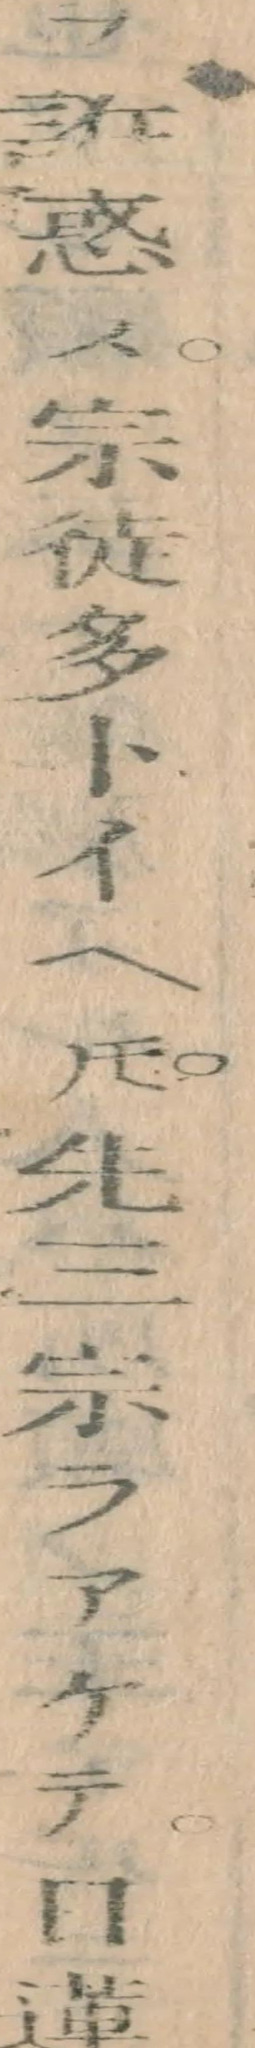ヲ誑惑ス。宗徒多トイヘトモ。先三宗ラアケテ。日蓮
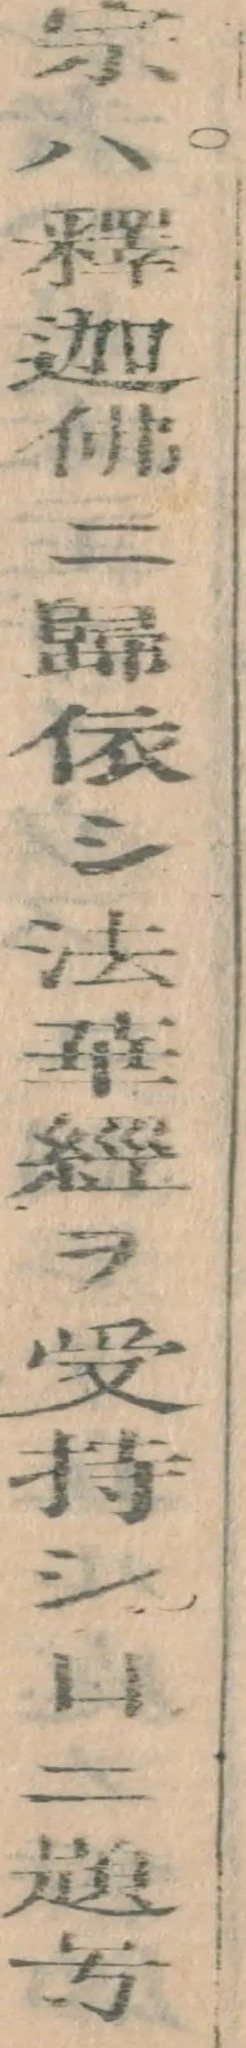宗ハ。釈迦仏ニ帰依シ法華経ヲ受持シ。口ニ題号
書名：南蛮寺興廃記
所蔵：国立国会図書館 National Diet Library, JAPAN
